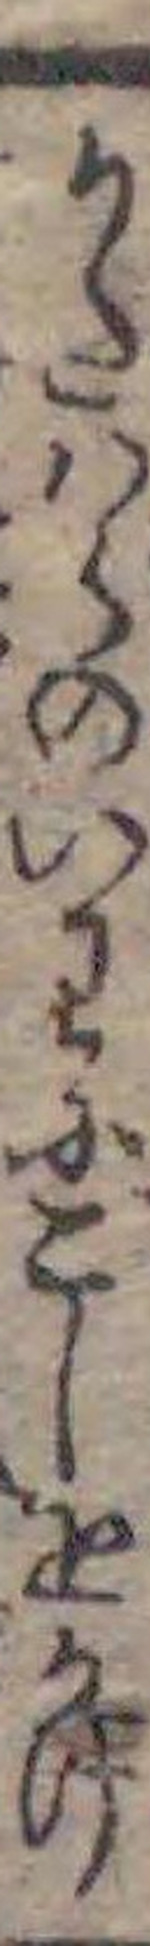かたはらのいわにこしをかけ
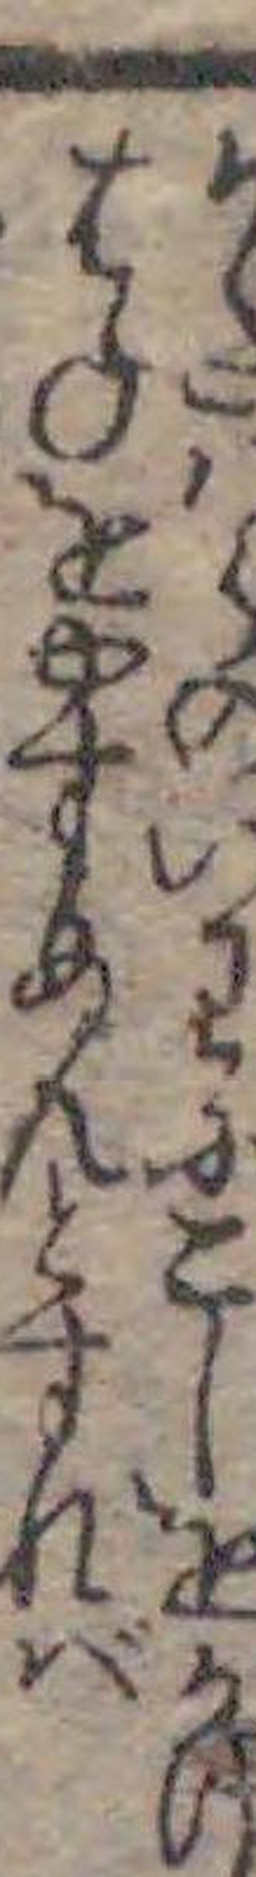はねをやすめんとすれば
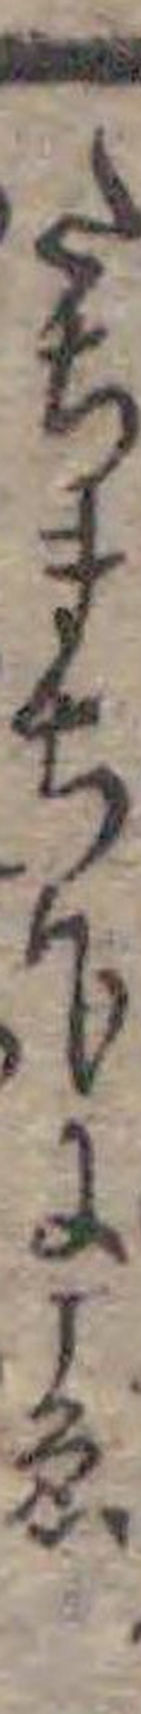たちまち下にこゑ
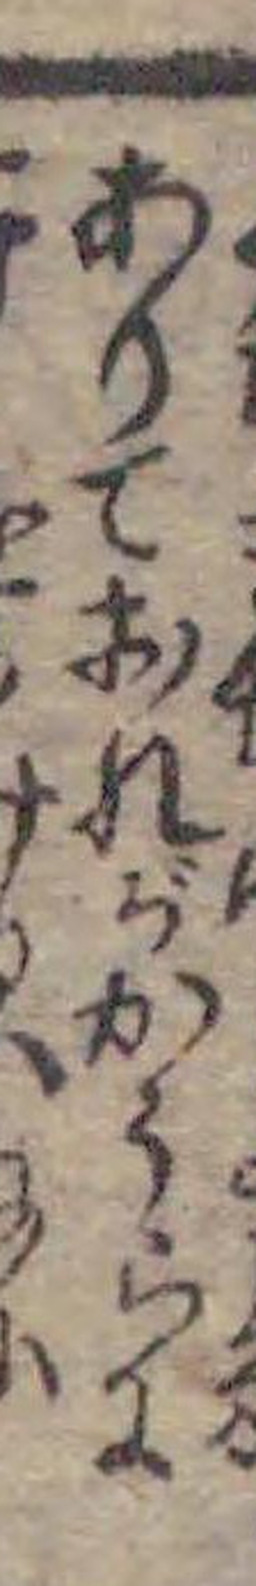ありておれがかうらに
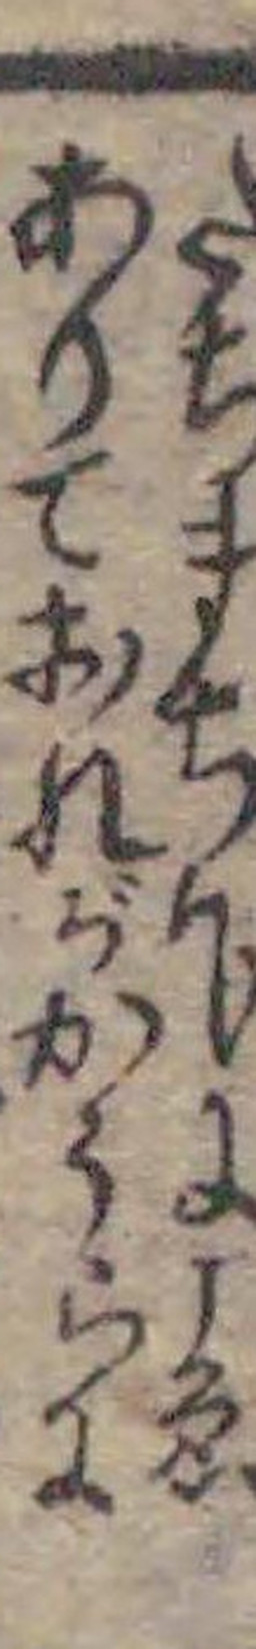ありておれがかうらに
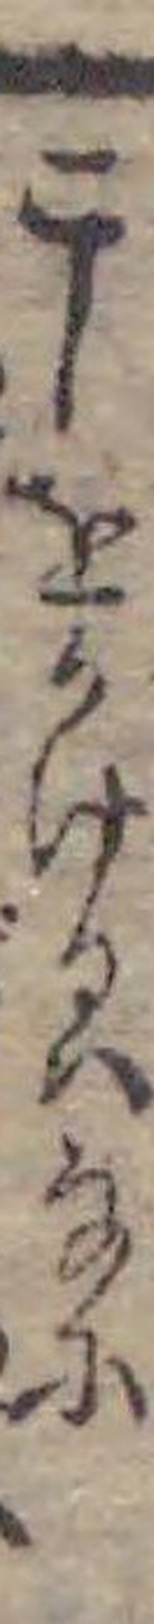こしをかけるはなに
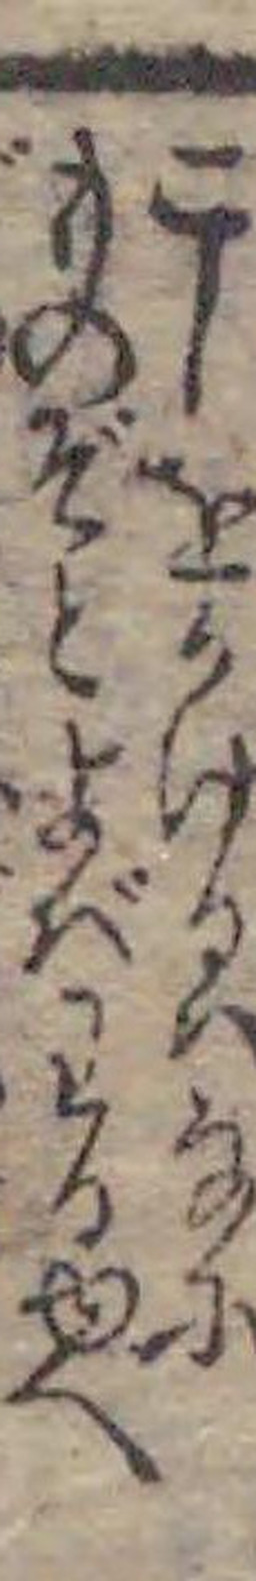ものぞとよばわるゆへ
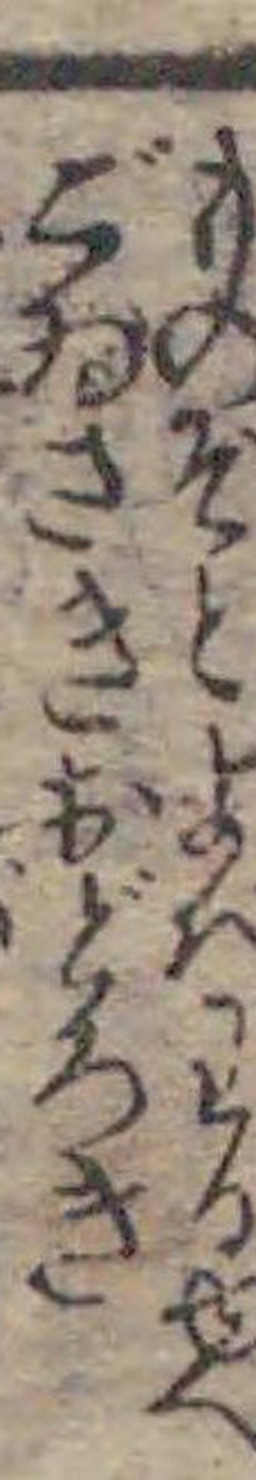ごゐさきおどろき
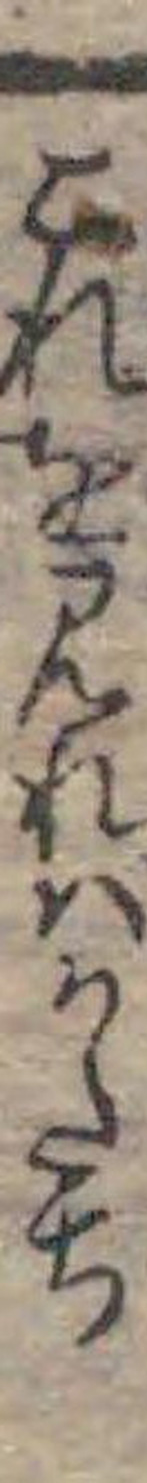これをみればかたち
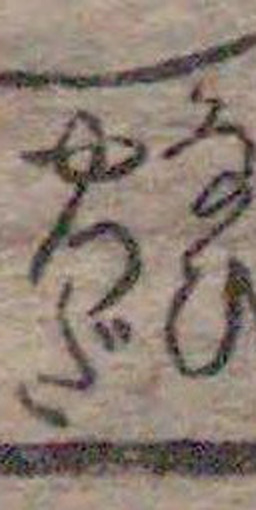やつだ
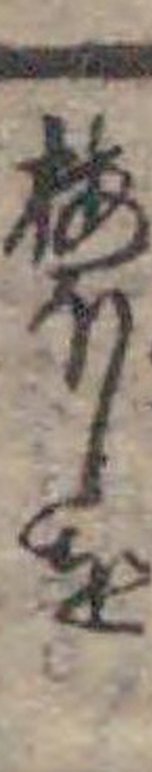梅ほしを
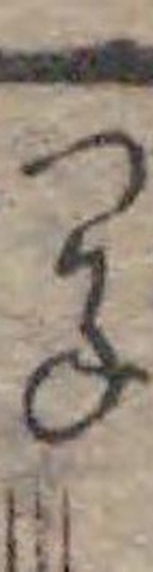つくね
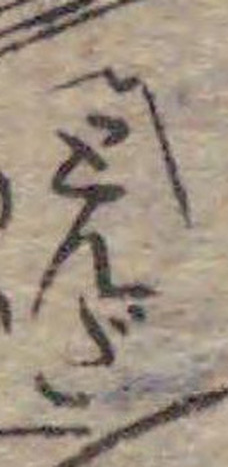〽とんだ
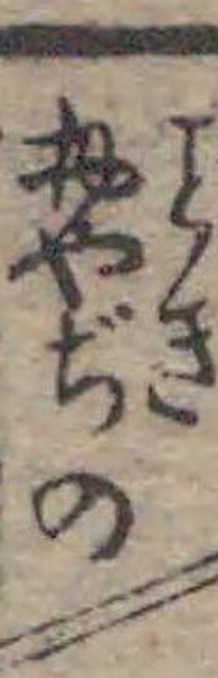おやぢの
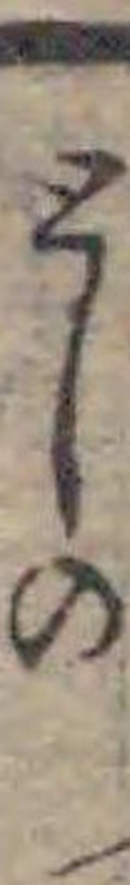としの
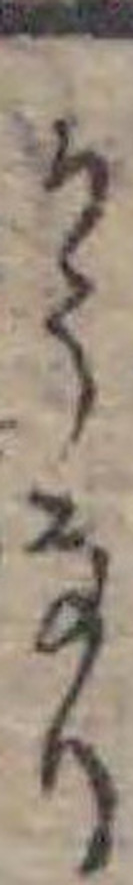かうなり
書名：怪物つれつれ草 : 2巻
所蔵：国立国会図書館 National Diet Library, JAPAN
